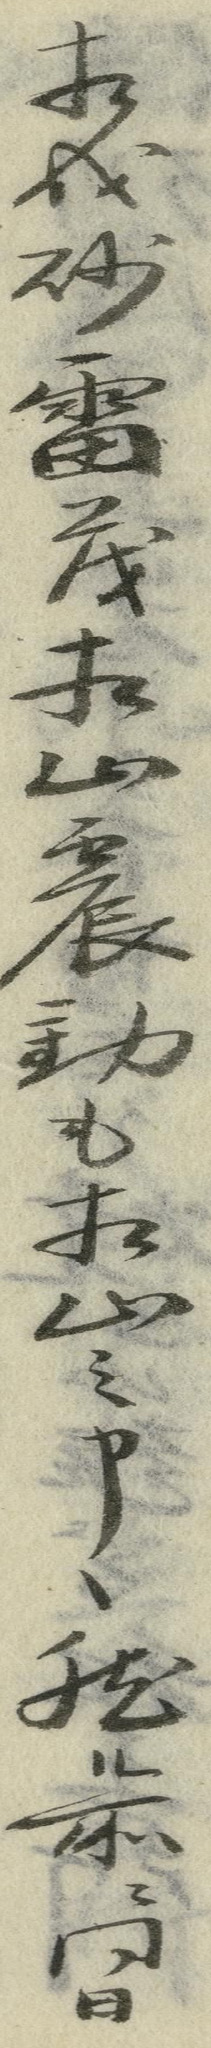相成砂雷茂相止震動も相止み申候然ル所ニ同日
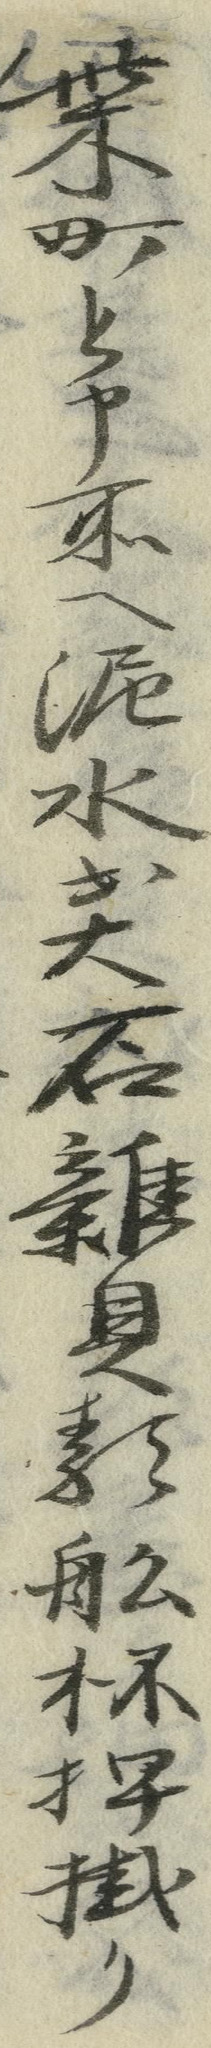柴町と申所へ泥水出大石雑具類船抔押掛リ
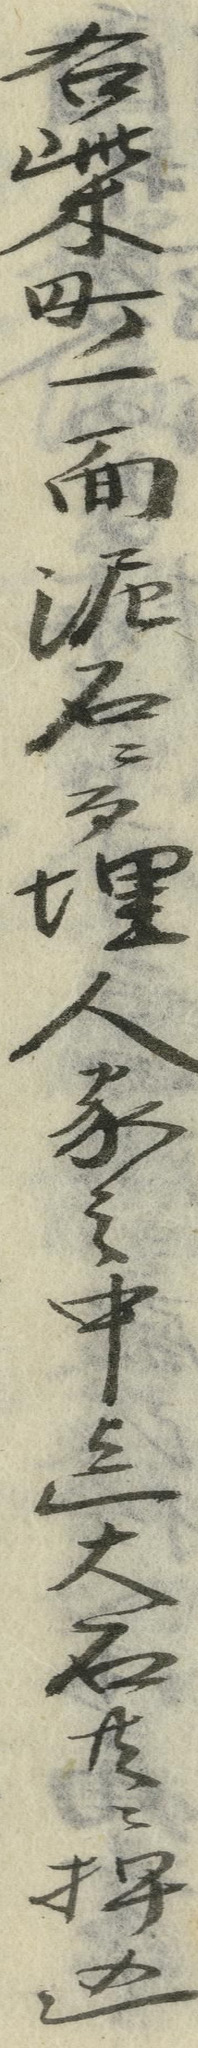右柴町一面泥石ニ而埋人家之中迄大石共ニ押込
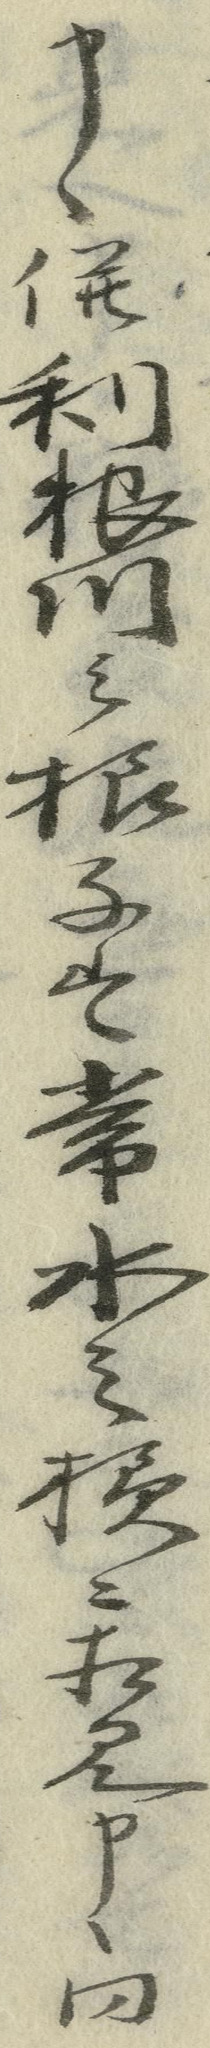申候併利根川之様子は常水之様ニ相見申候同
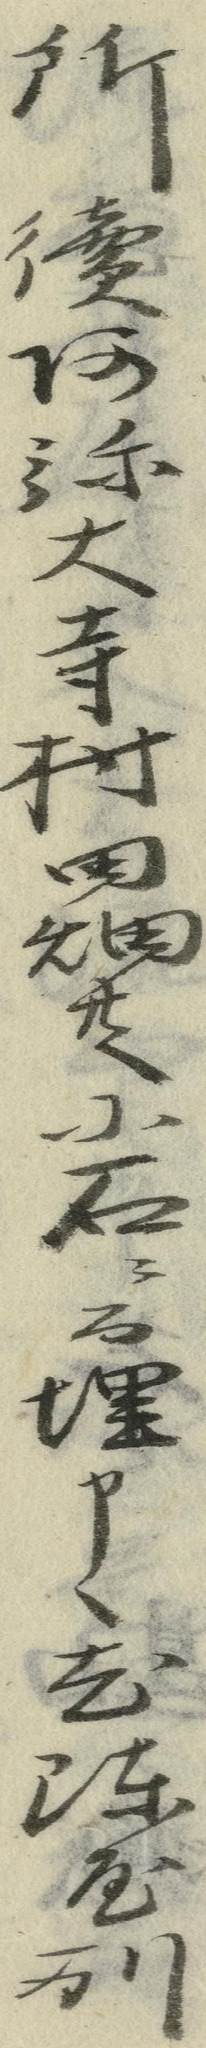所続阿弥大寺村田畑共小石ニ而埋申候尤陣屋別
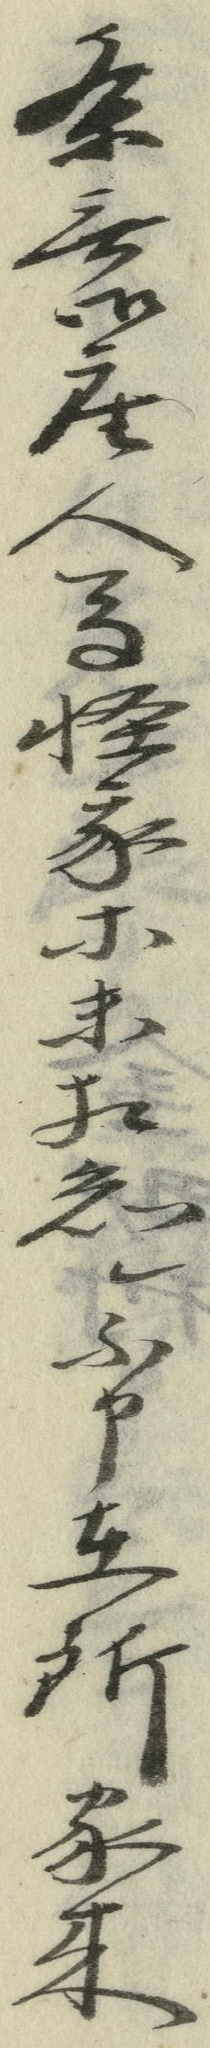条無御座人馬怪我等未相知レ不申在所家来
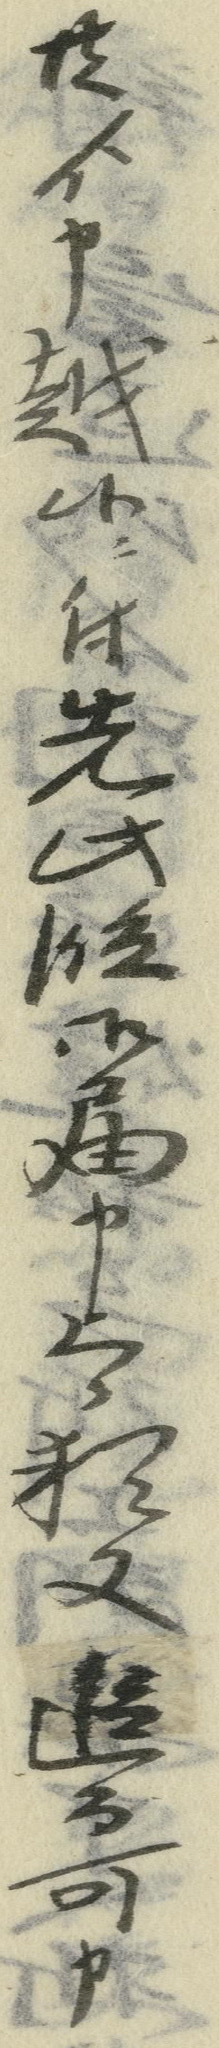共ゟ申越候ニ付先此段御届申上候猶又追而可申
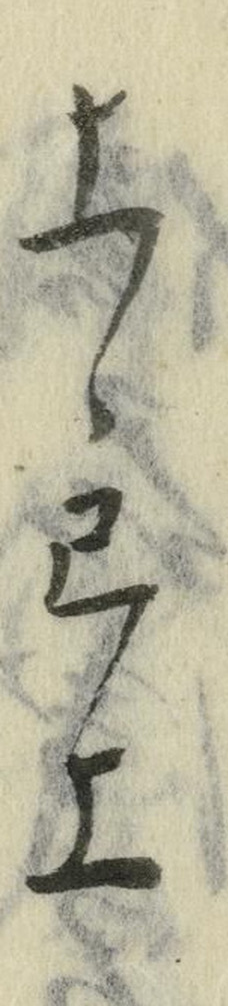上候已上
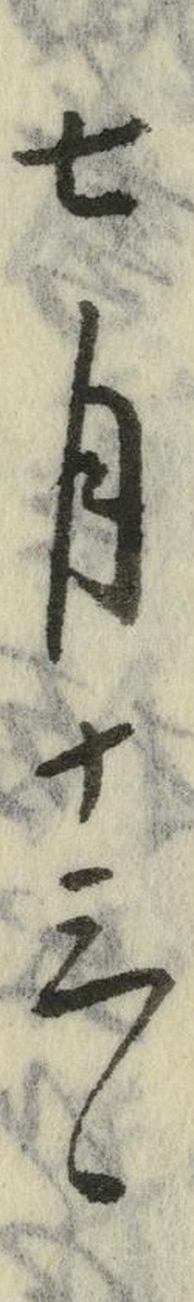七月十三日
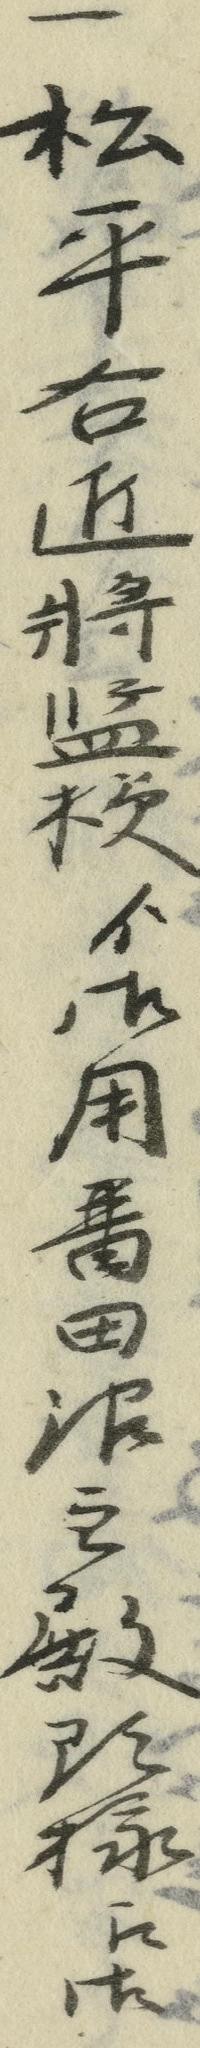一松平右近将監様ゟ御用番田沼主殿頭様江御
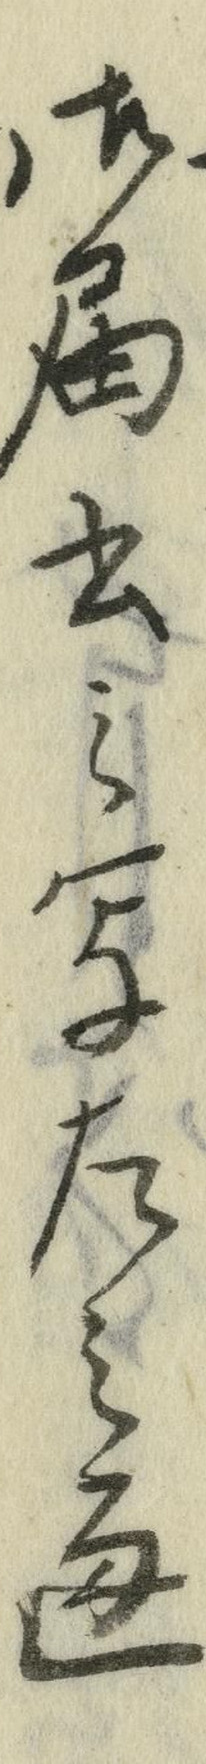御届出之写左之通
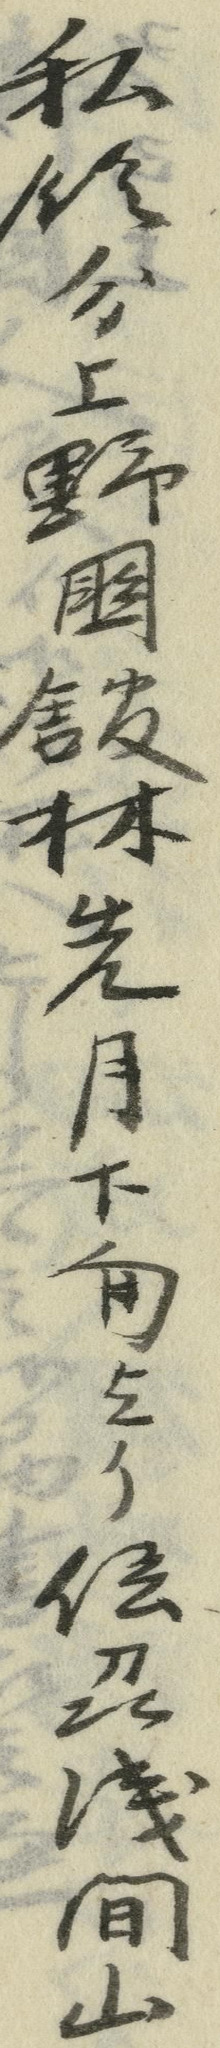私領分上野国館林先月下旬より信州浅間山
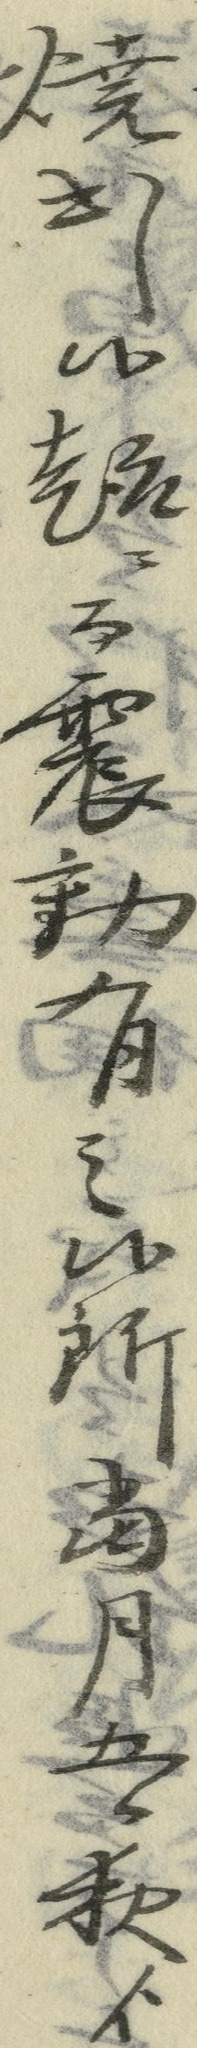焼出し候趣ニ而震動有之候所当月五日夜ゟ
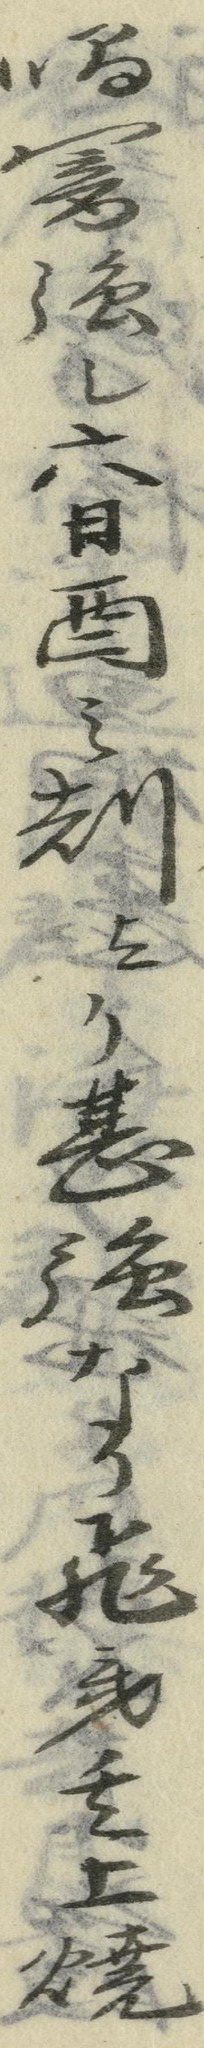鳴響強シ六日酉之刻より甚強なり飛身其上焼
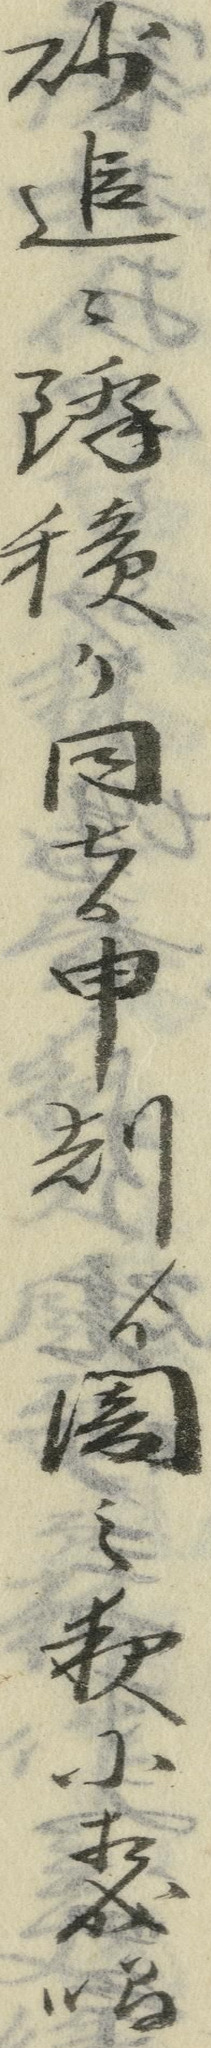砂追々降積リ同七日申刻ゟ闇之夜に相成鳴

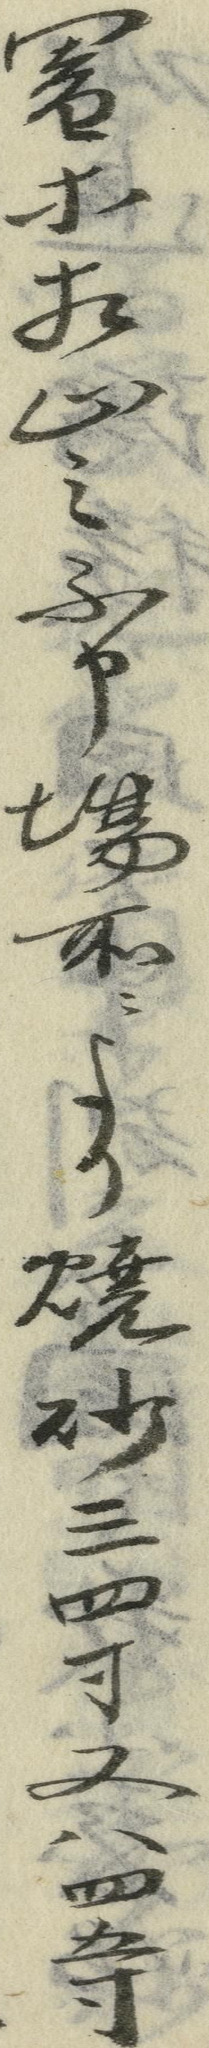響等相止み不申場所ニより焼砂三四寸又は四五寸
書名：天明三癸卯七月信州浅間山焼出シ上州山津浪ニ付近國ヨリ御届書并訴書写
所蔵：東京大学地震研究所図書室 Earthquake Research Institute Library, The University of Tokyo, JAPAN
